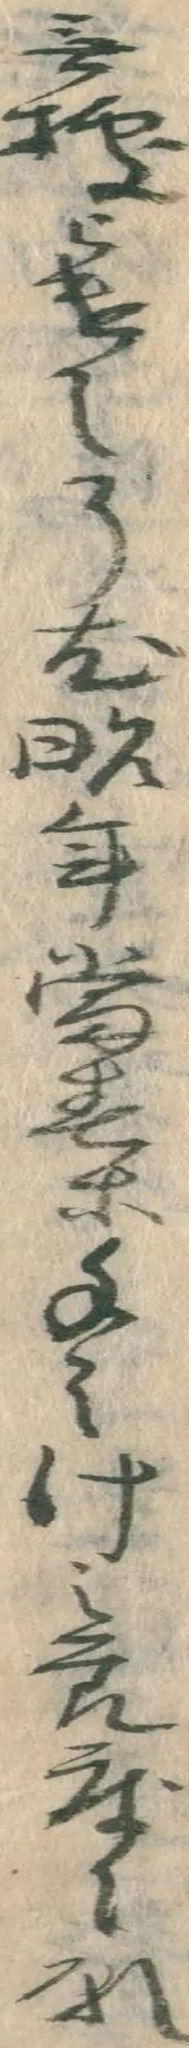無拠被遣之了尤昨年當春等手之汁之節度々願
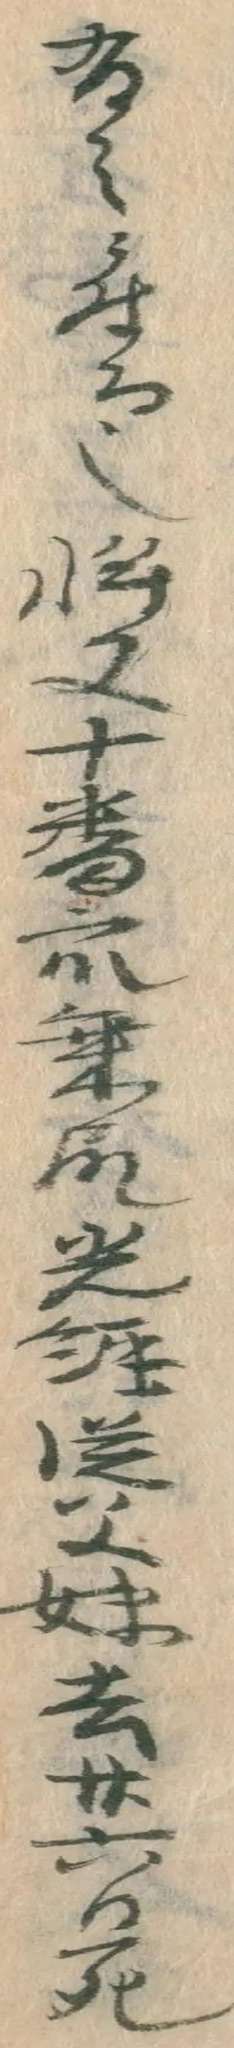有之ニ付而也将又十番衆乗尻光経従父妹去廿六日死

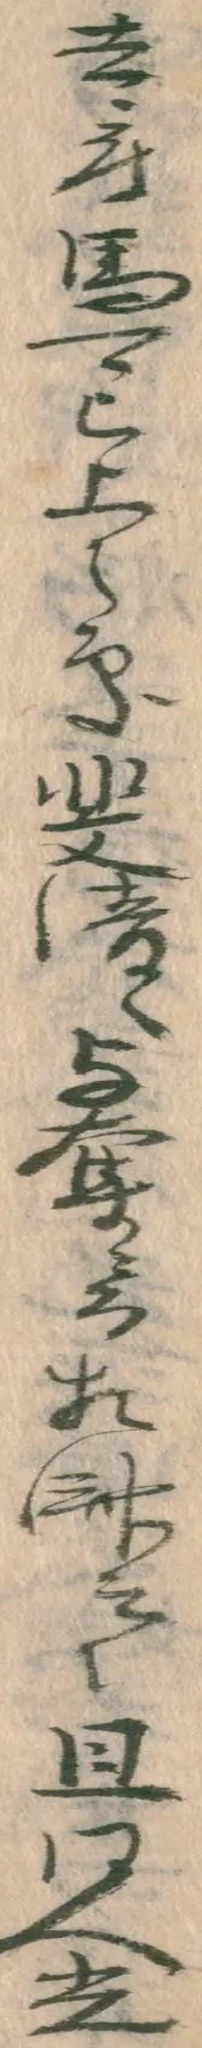去ニ付馬可被上候處斐清へ与奪ニ而相済云々且同人光
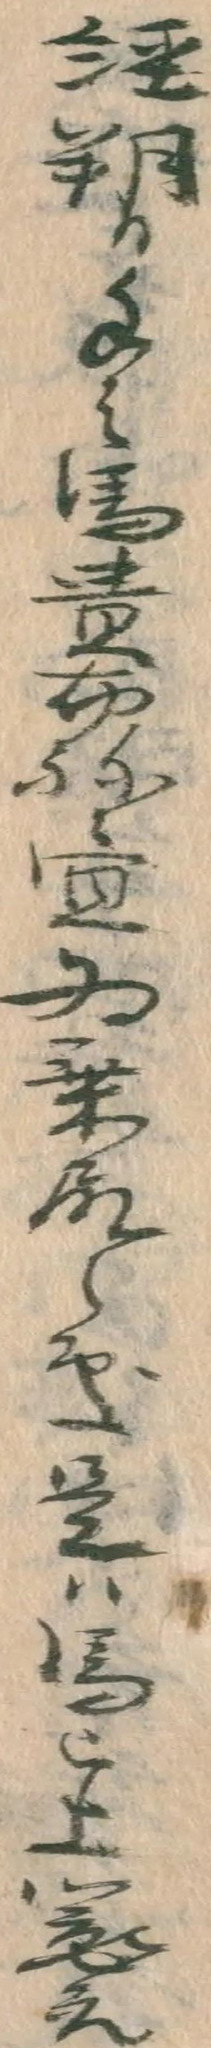経朔日手之馬責布弥々宜為乗仕尻候處是ハ馬被上鬮取
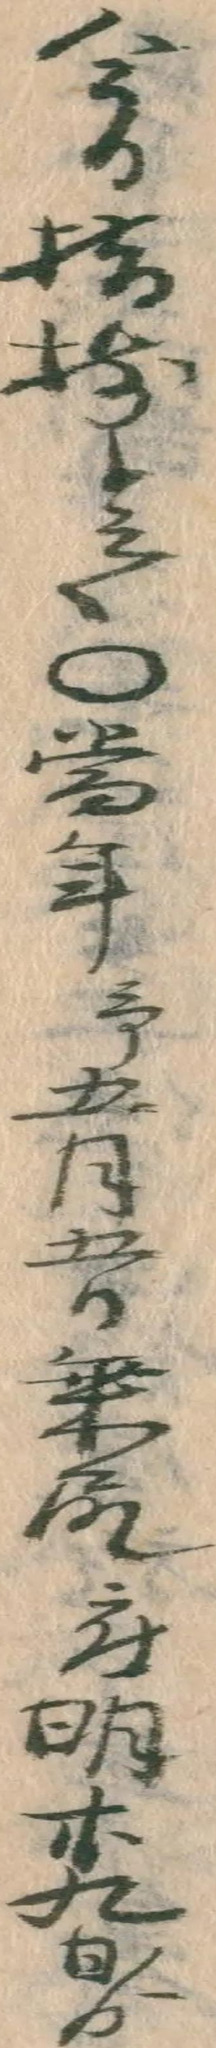今日指揃ト云々〇當年予五月五日乗尻ニ付明廿九日ゟ
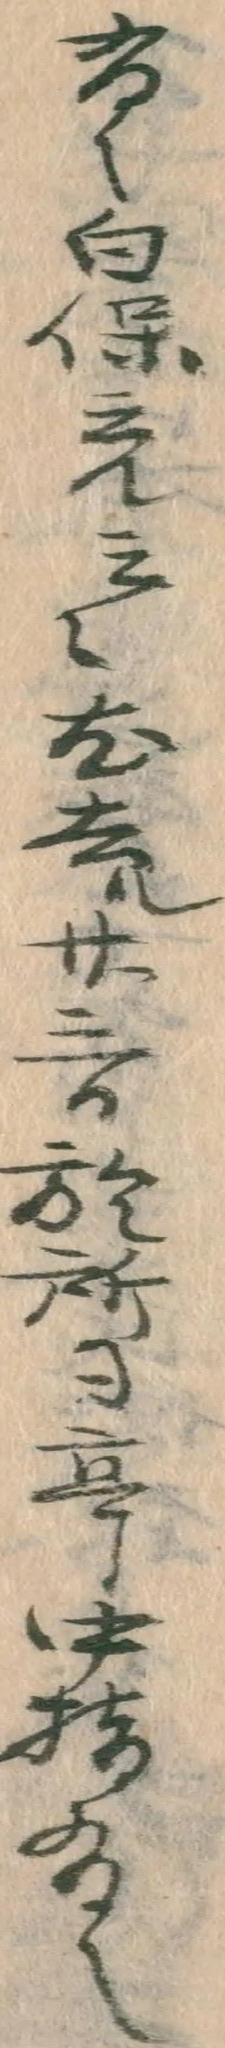有之白保云候云々尤去ル廿三日於所司亭中指有之
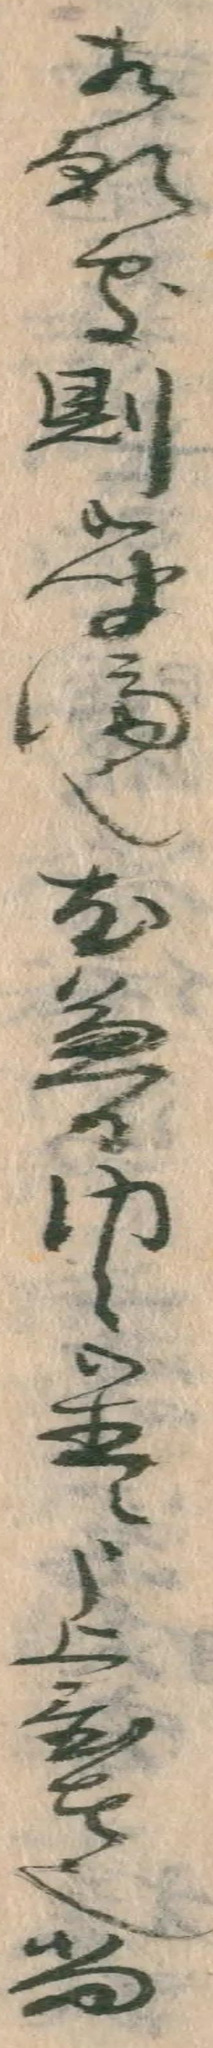相願處則御聞済也尤兼而内々御直二申上置者也當
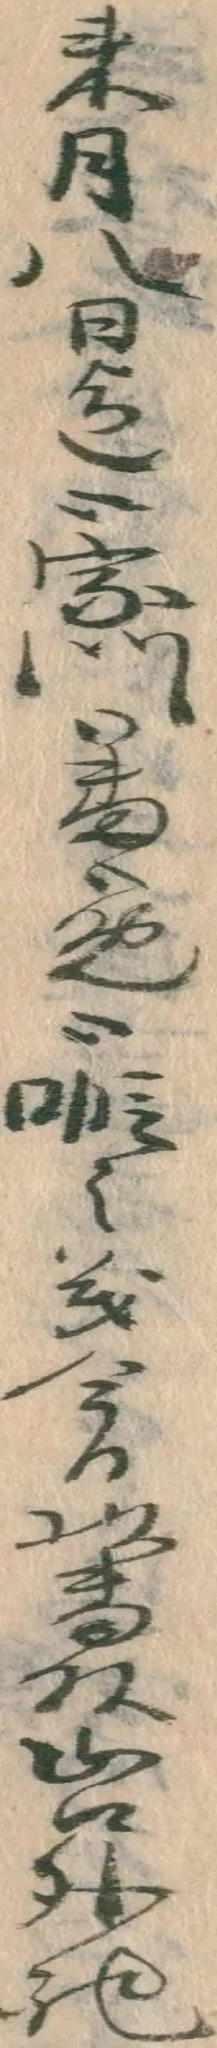来月八日迄御家門御番御免御暇之義今日以番頭山口外記
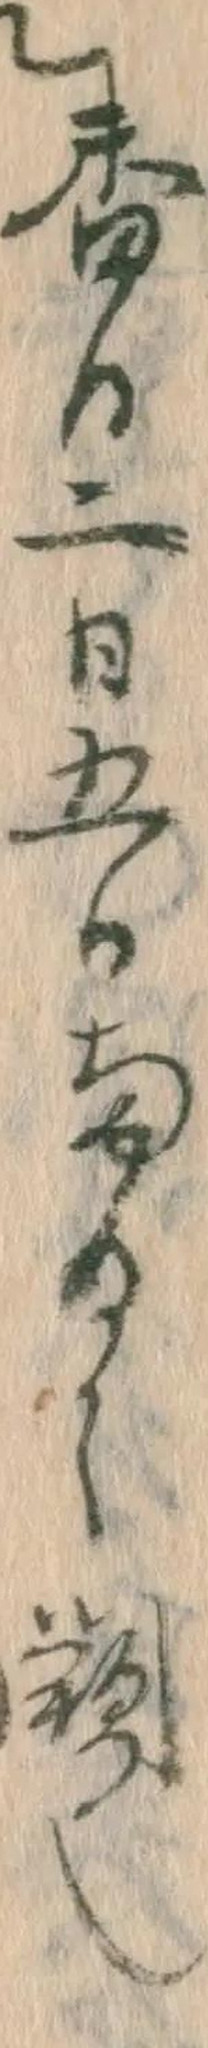番日二日五日両日之闕也
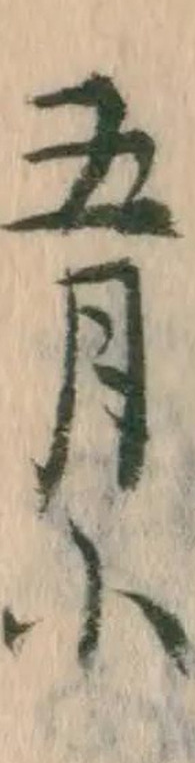五月小
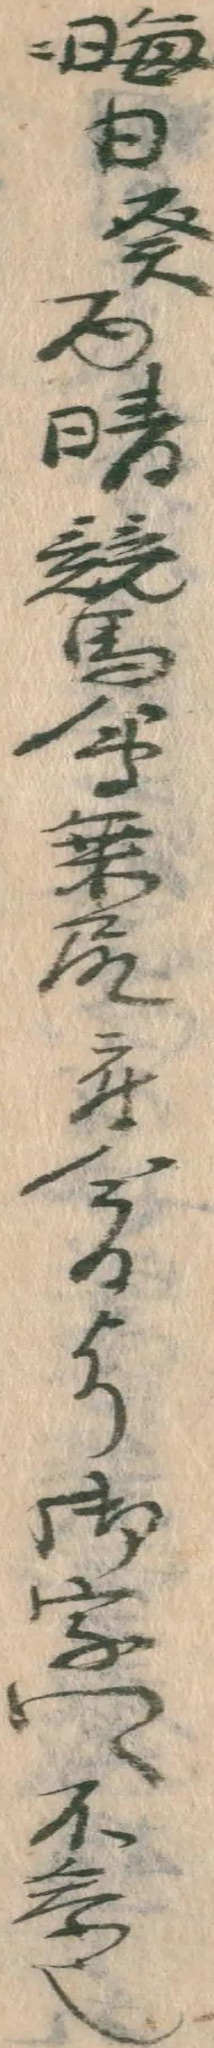晦日癸酉晴競馬會乗尻ニ付今日より御家門へ不参也
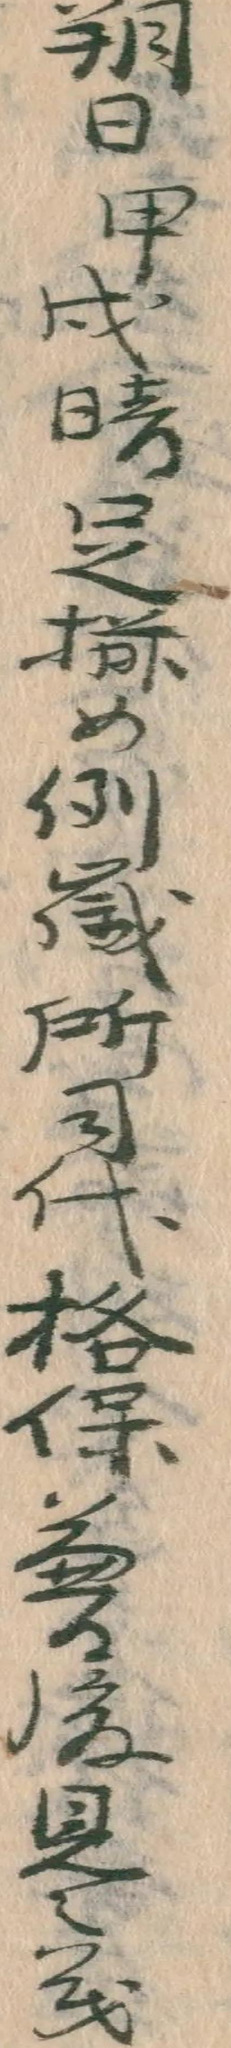朔日甲戌晴足揃如例歳所司代格保兼日後見之義
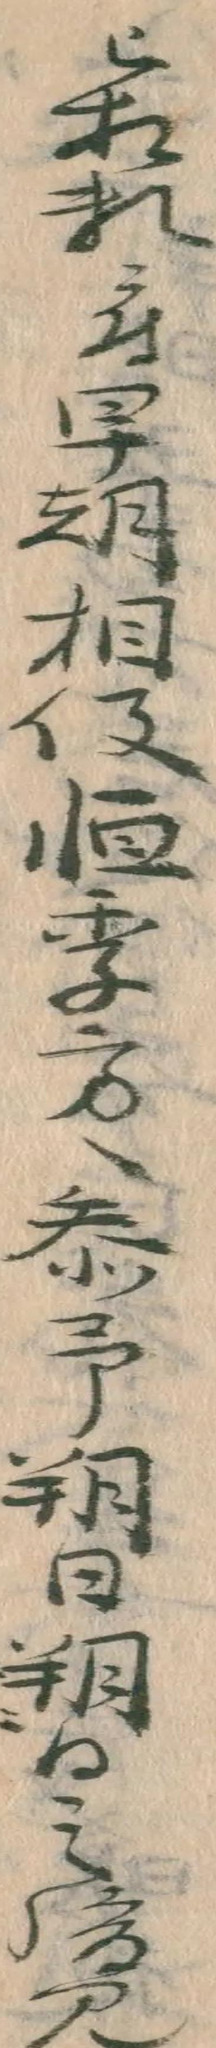被相頼ニ付早朝相役恒季方へ参予朔日朔日之後見
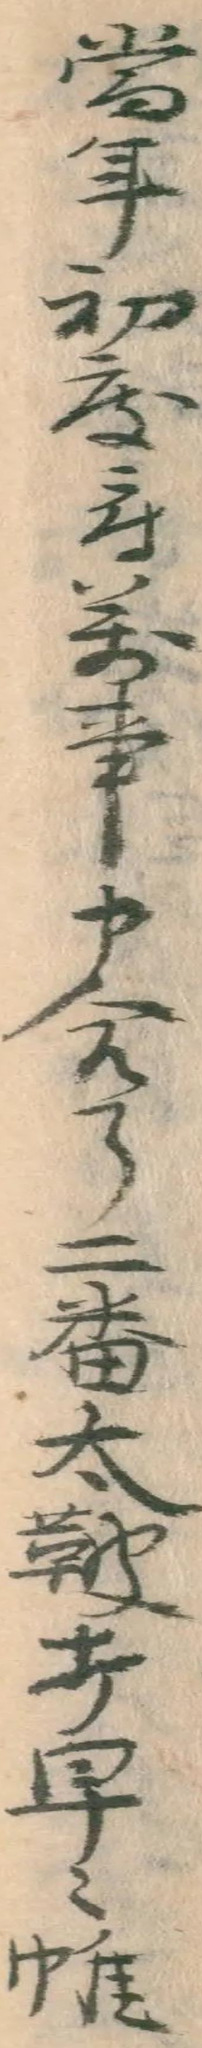當年初度ニ付萬事申合了二番太鼓打早々帷
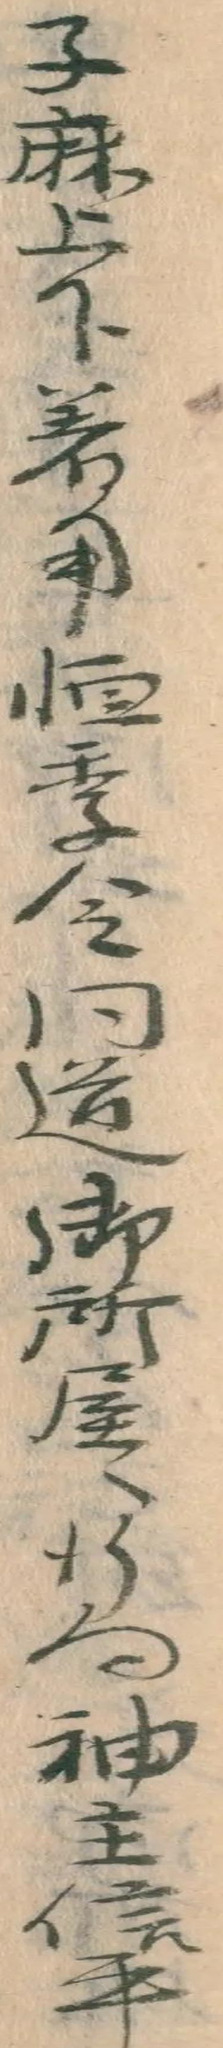子麻上下着用恒季令同道御所屋へ行向神主信平
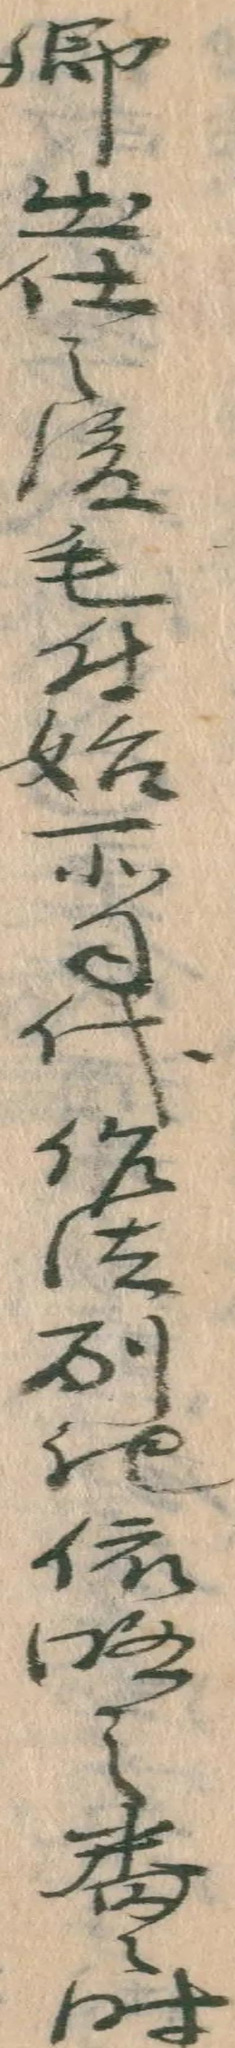卿出仕之後毛付始所司代作法別記依略之番之時
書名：賀茂社記録. 第63冊
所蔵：国立国会図書館 National Diet Library, JAPAN
